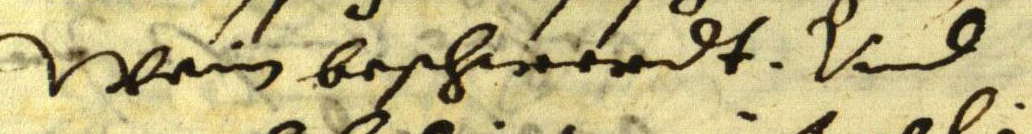Wein beschwerdt. vnd
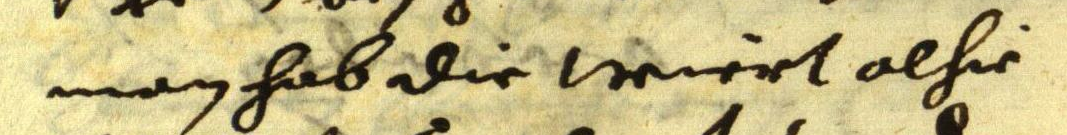man hab die Wiert alhie
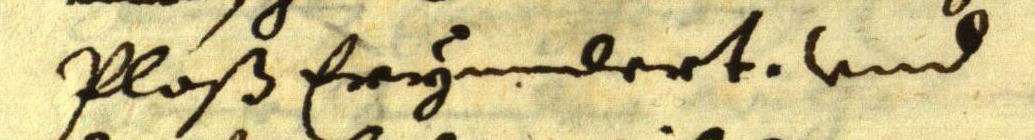Ploß Erȳnndert vnd
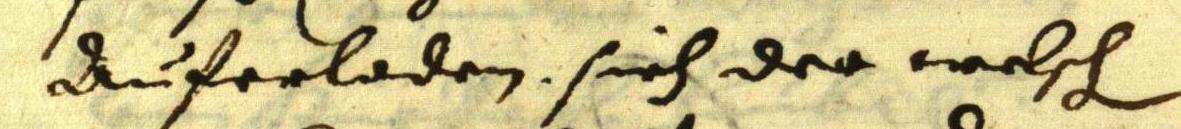Aūferladen. sich der welsch
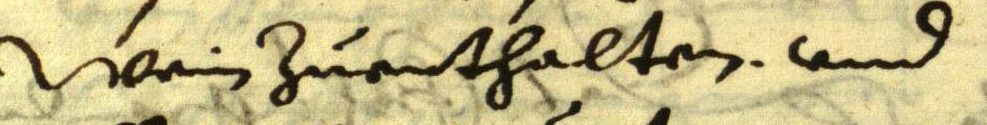Wein Zūenthalten. vnd
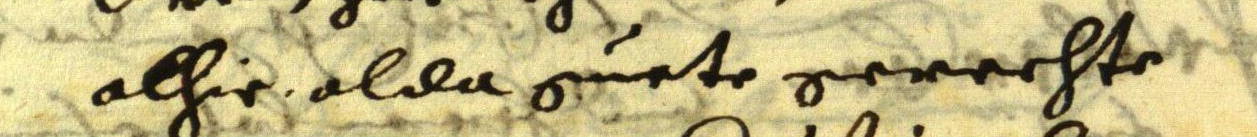alhie. alda gūete gerechte
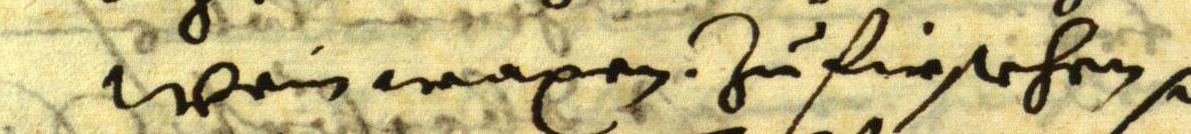Wein waxen. Zū firsehen etc
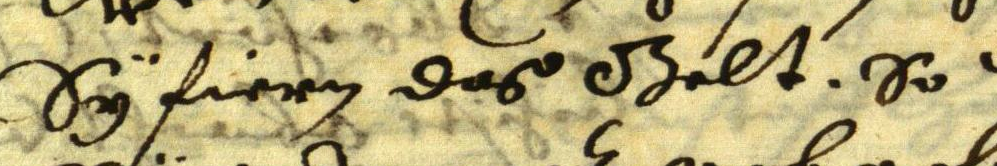Sÿ fiern das Gelt. so
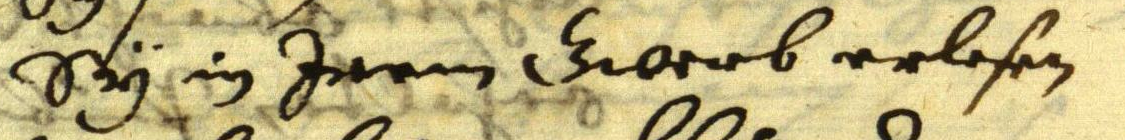Sÿ in Irem Gwerb erlesen
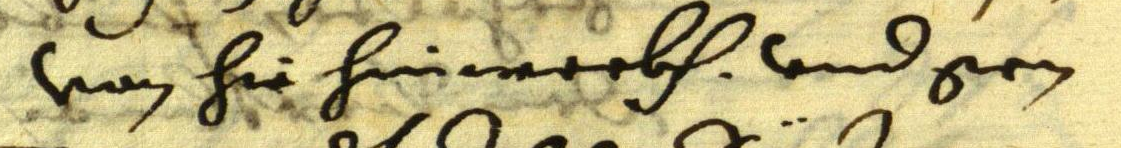von hie hinweckh. vnd gen
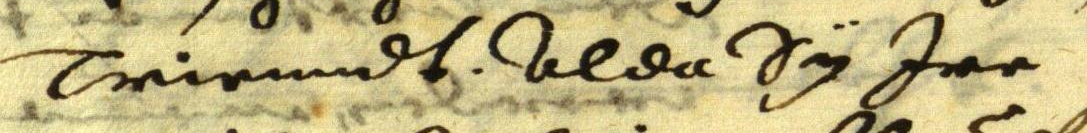Trienndt. Alda Sÿ Ire
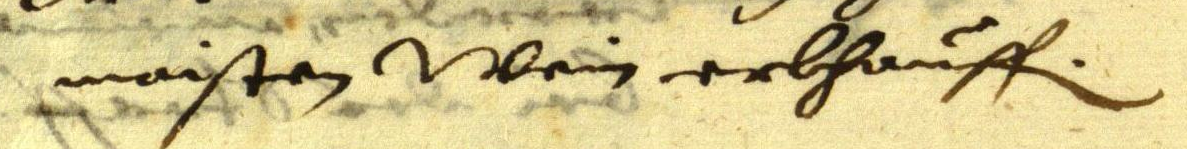maisten Wein erkhaūff.
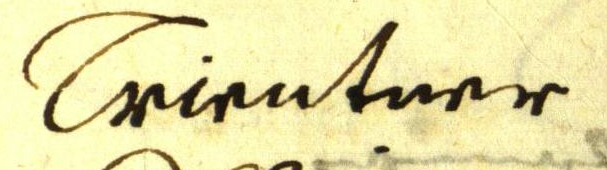Trientner
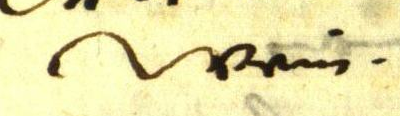Wein.
